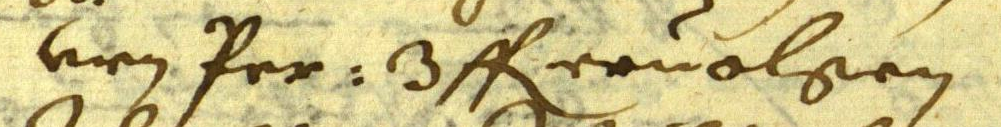v̈rn Per: 3 fl erūolgen
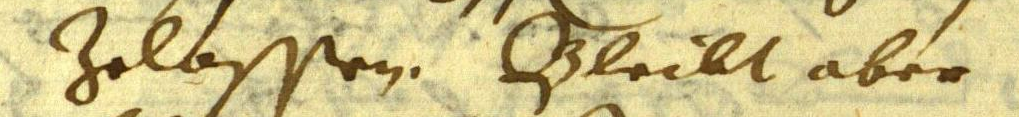Zelassen. Bleibt aber
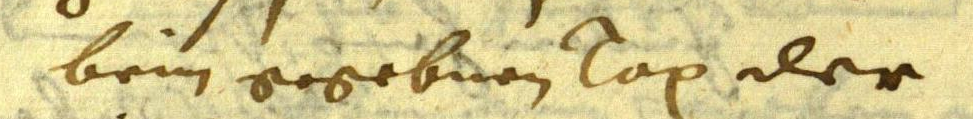beim gegebnen Tax der
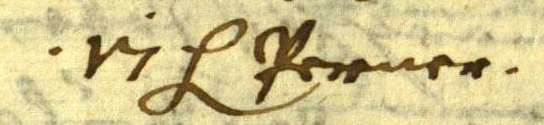.12 L Perner.
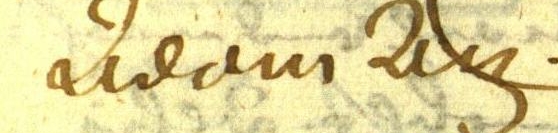Adam Az¬
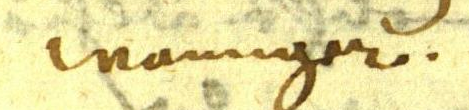wannger.
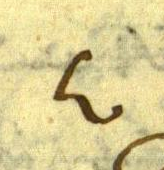t
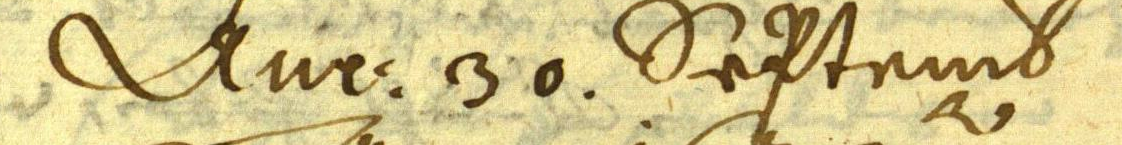Am: 30. SePtemb
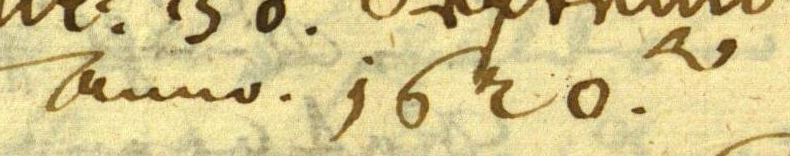Anno .1620.t
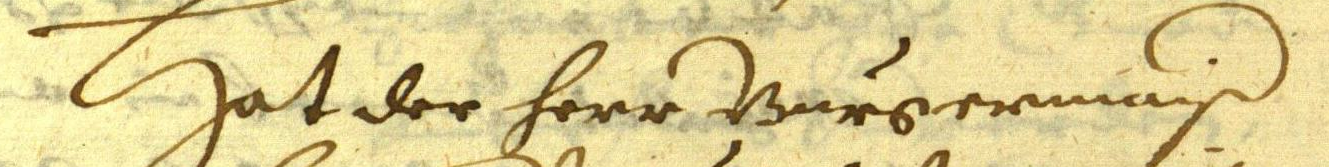Hat der herr Būrgermaist
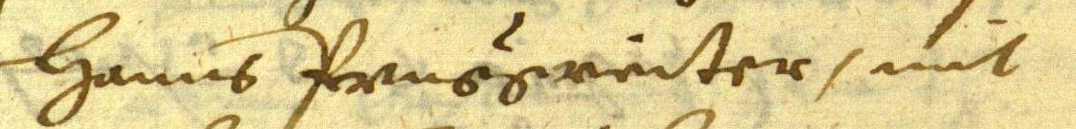Hanns Prūggreiter, mit
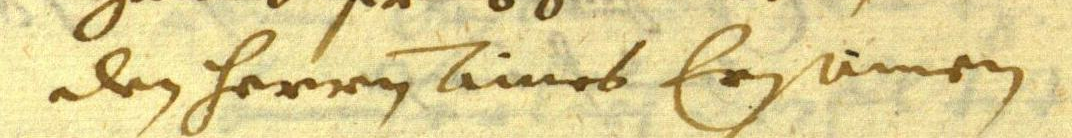den herrn Aines Ersamen
